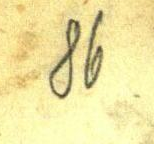86
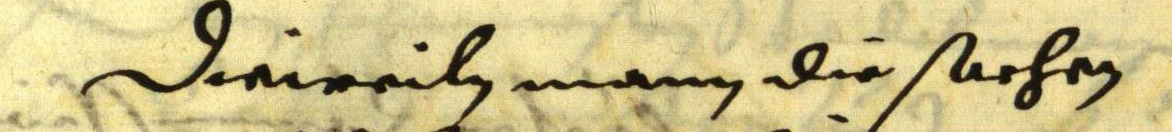dieweiln mann die sachen
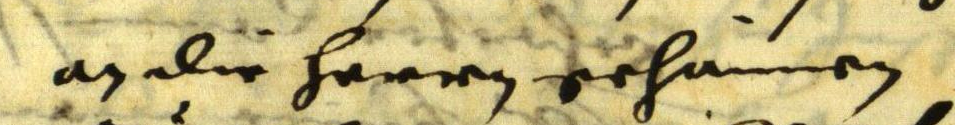an die herrn gehaimen
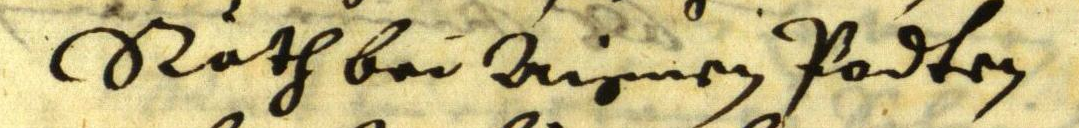Rāth bei Aignen Podten
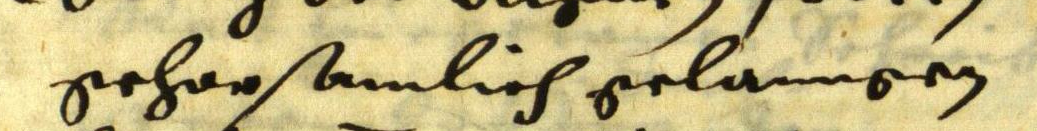gehorsamlich gelanngen
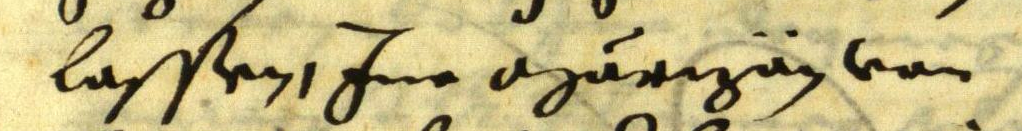lassen, Ine Mārzän von
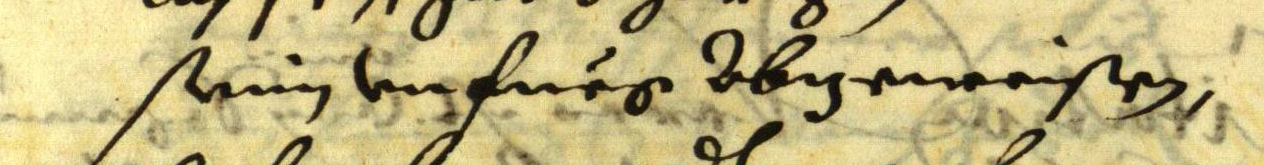seim vnfūeg Abzeweisen,
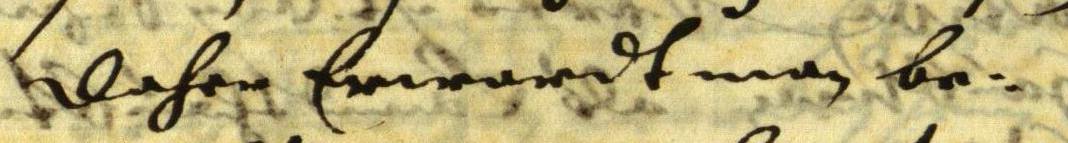daher Erwardt man be¬
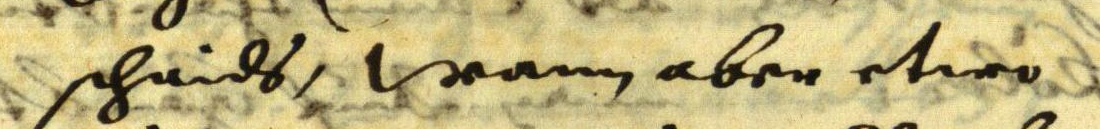schaids, wann aber etwa
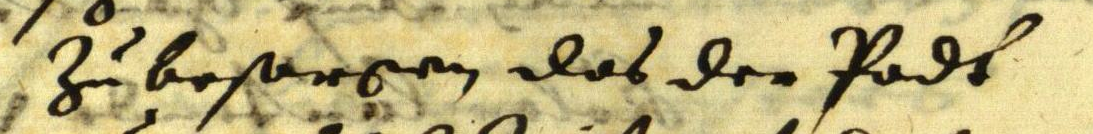Zū besorgen das der Podt
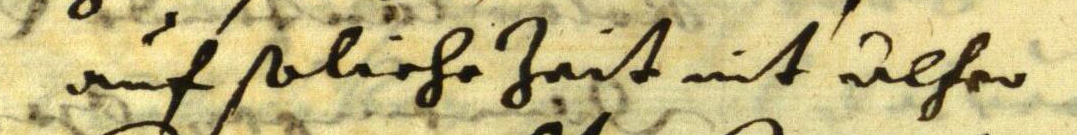aūf soliche Zeit nit Alher
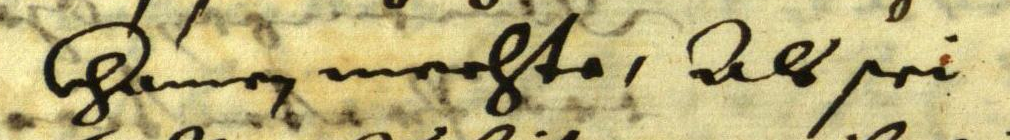khomen mechte, Als sei
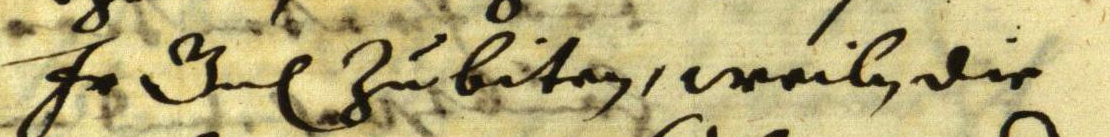Ir Gn Zū biten, weiln die
